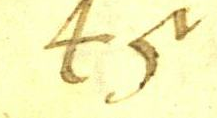45
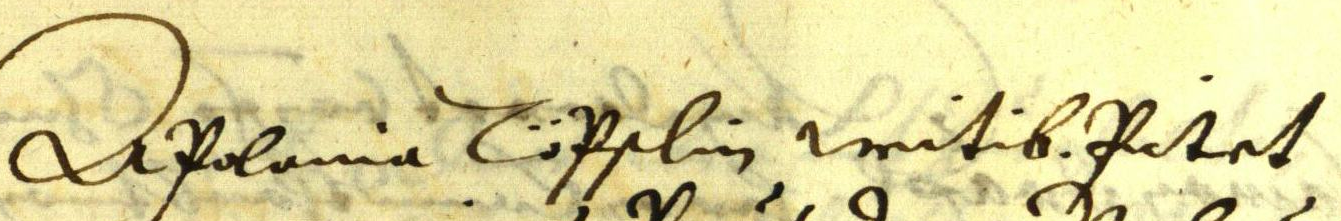Apolonia TöPslin witib. Pitet
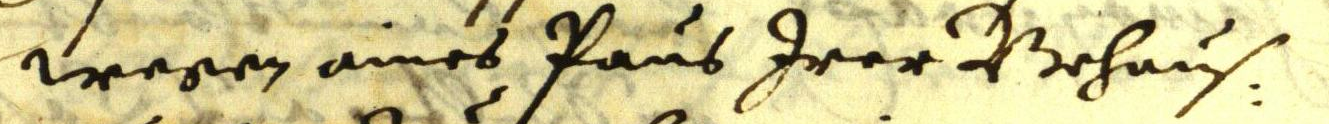wegen aines Paūs Irer Behaūs¬
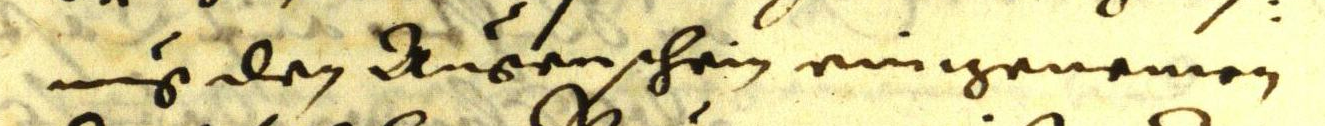ūng den Aūgenschein einzenemen
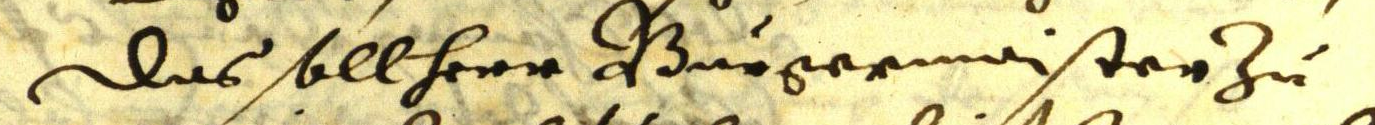das soll herr Būrgermaister Zū
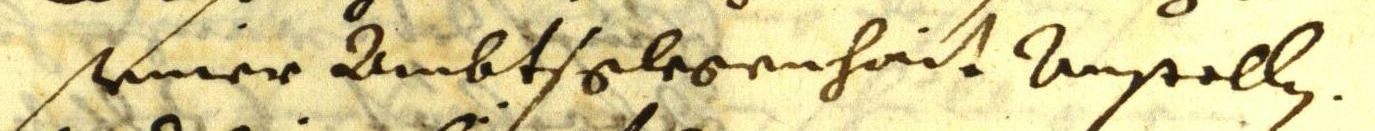seiner Ambtsglegenhait Anstelln.
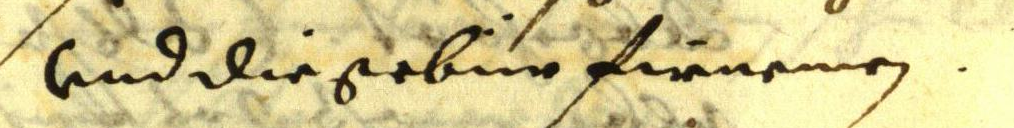vnd die gebür firnemen.
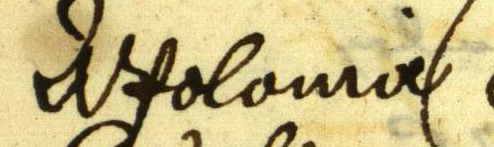Apolonia
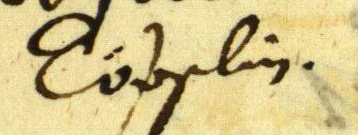Töpslin.
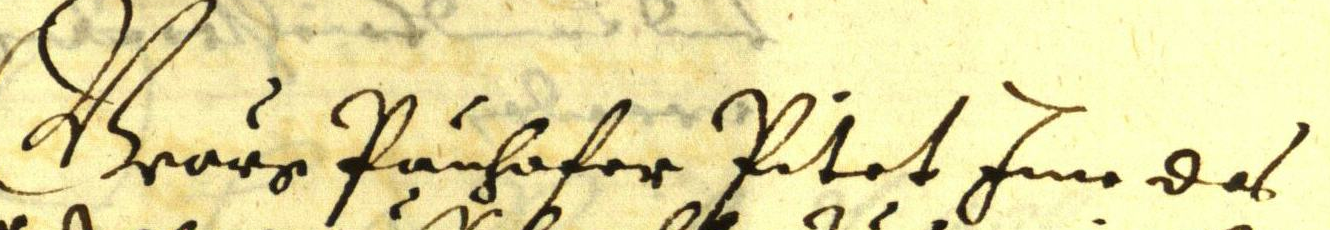Geōrg Paūhofer Pitet Ime das
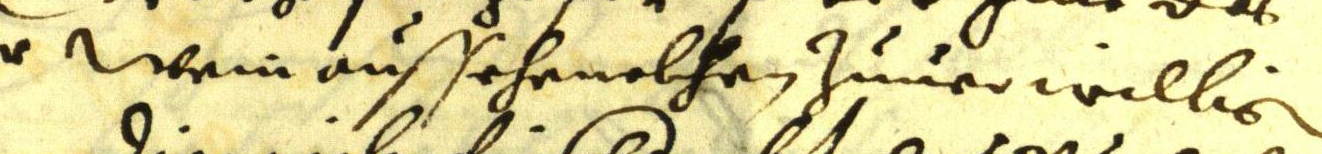Wein aūsschenckhen Zūūerwillig
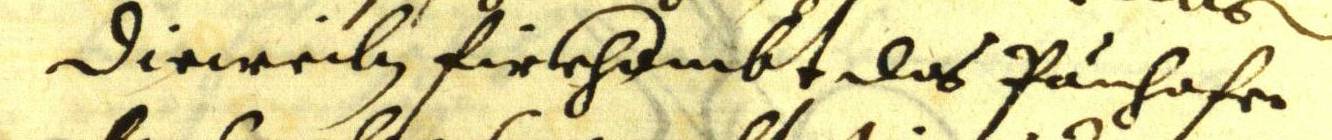Dieweiln firkhombt das Paūhofer
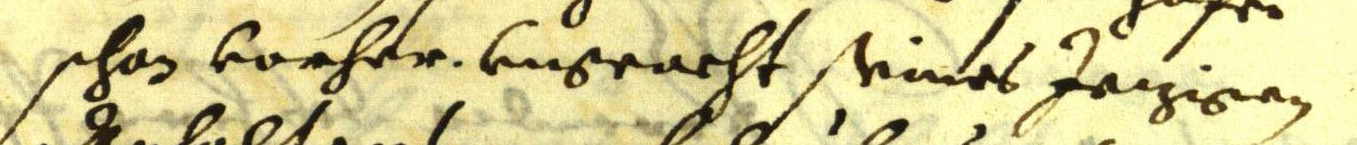schon vorher. ungeacht seines Jezigen
